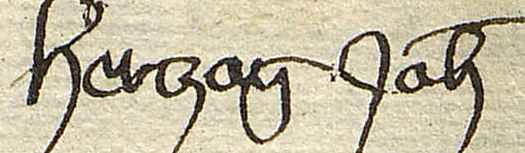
hercʒog Ioh*
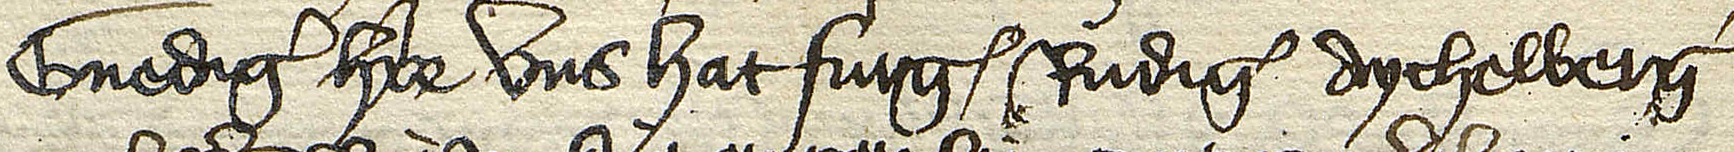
Gnedig* h*re Vns hat fürg* Rüdig* Aychelberg*
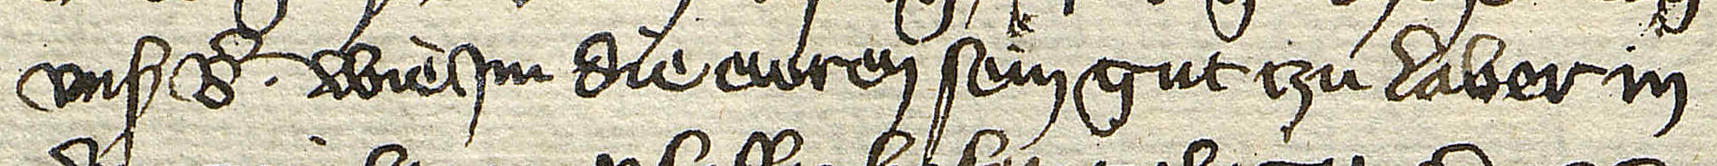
vnſ* B* . wie Im die ewren ſein gut cʒu laber in
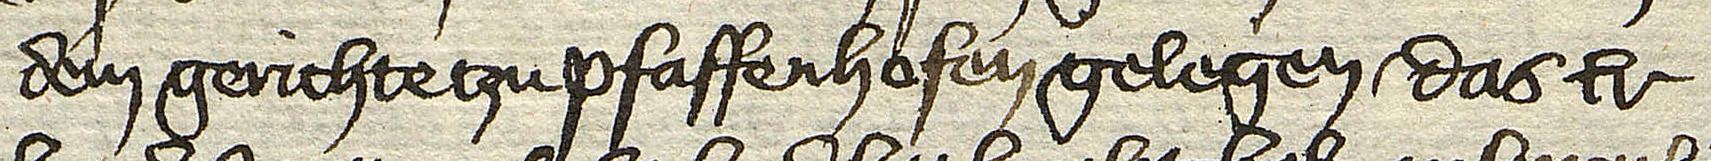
dem gerichte cʒu pfaffenhofen gelegen das Er
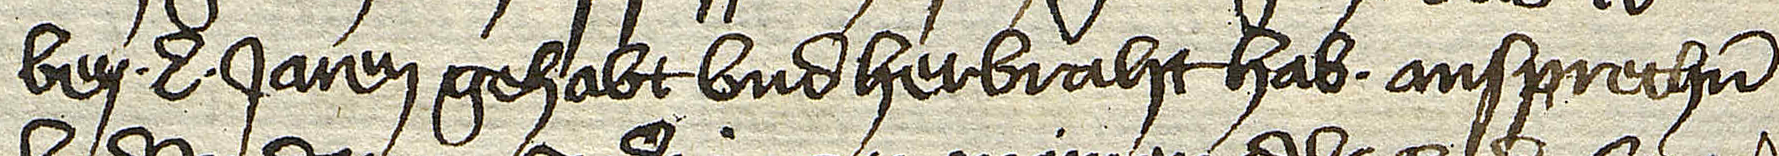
bey . L . Iaren gehabt vnd herbraht hab . anſprech*n
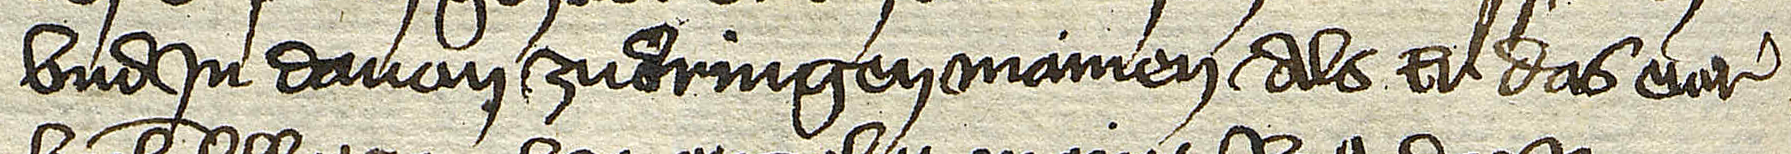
vnd In dauon ʒudringen mainen / Als Er das ewr*
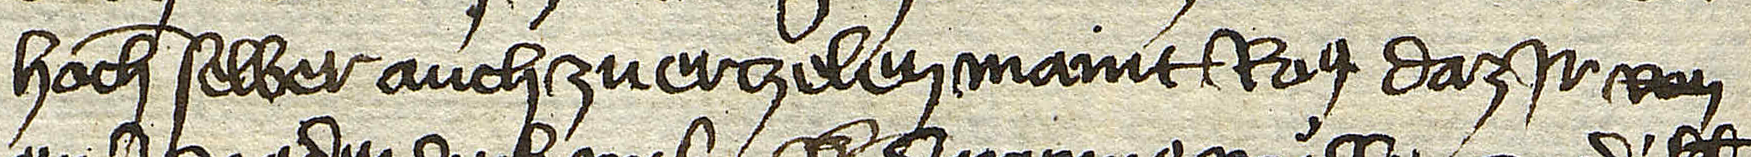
hoch* ſelber auch ʒu ercʒelen maint Ro* daʒ Ir von
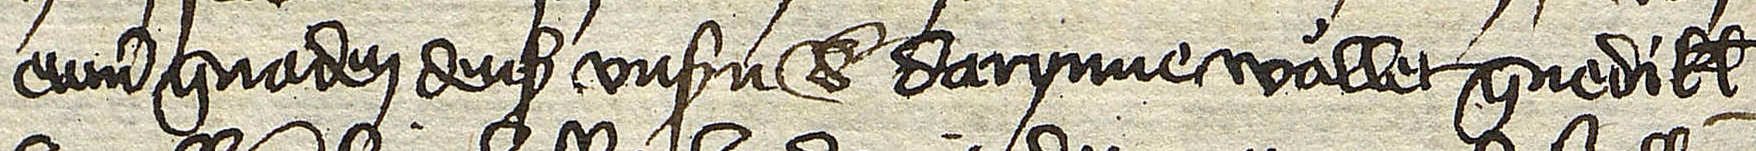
ewn* gnaden denſ* vnſ*n B* darynne wöllet gnedikl*
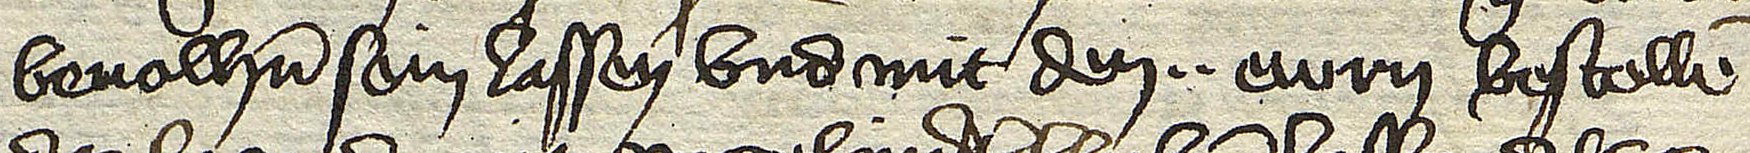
beuolhn* ſein laſſen vnd mit den ~ ewrn beſtelle*
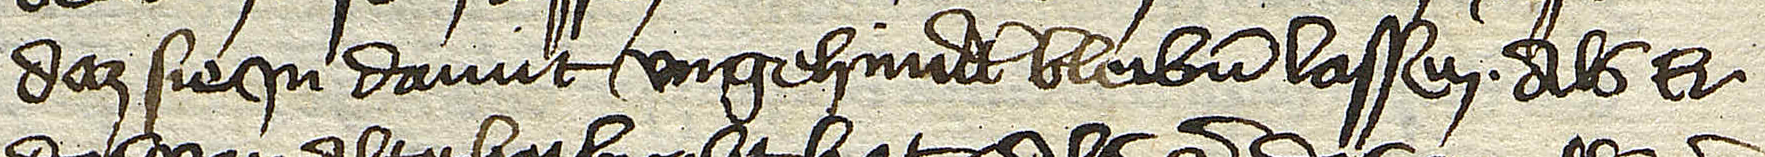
daʒ ſie In damit vngehindt* bleib*n laſſen . Als Er
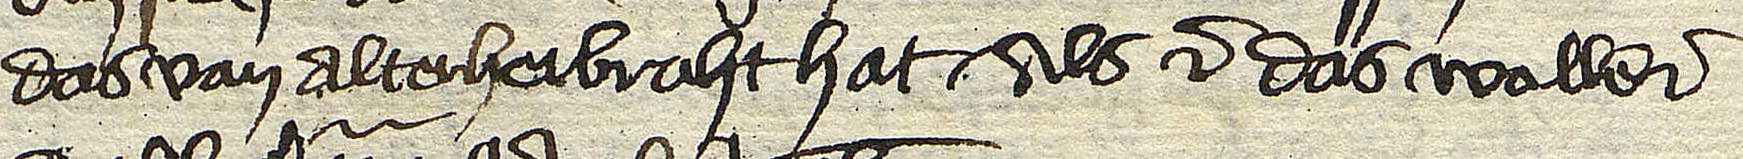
das von Alterherbraht hat / Als ec* das wollen* ec*
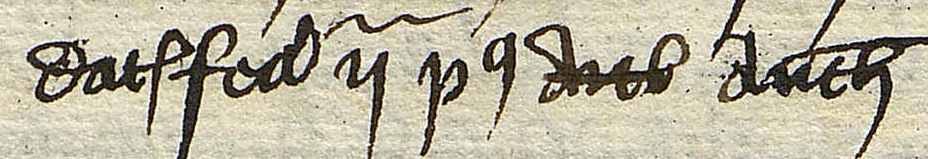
Dat* fe*a ii* p* Arth Anth*
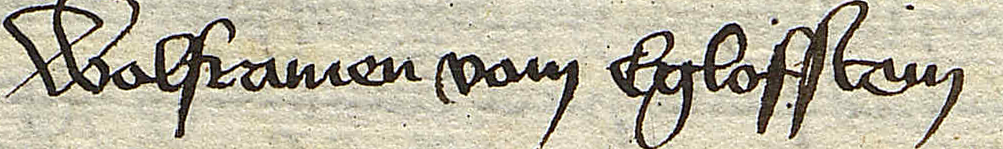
Wolframen von Eglofſtein
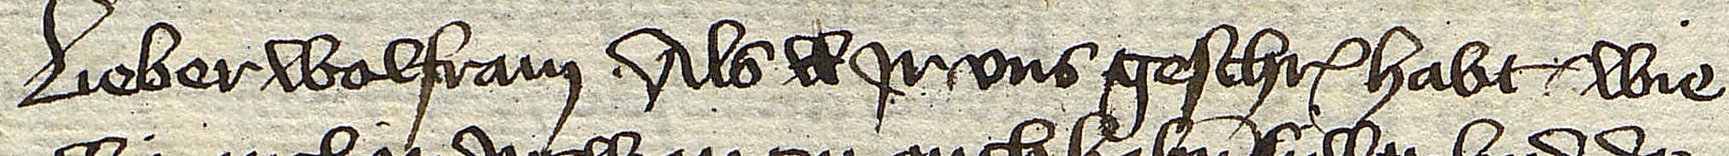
Lieber Wolfram . Als w Ir vns geſchr* habt / wie
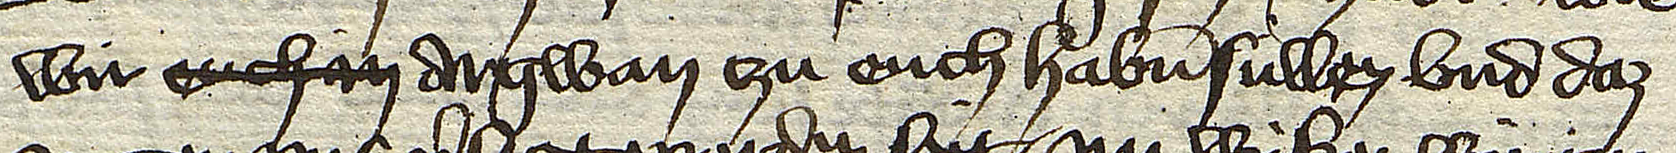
wir euch in Argwan cʒu euch hab*n ſüllen vnd daʒ
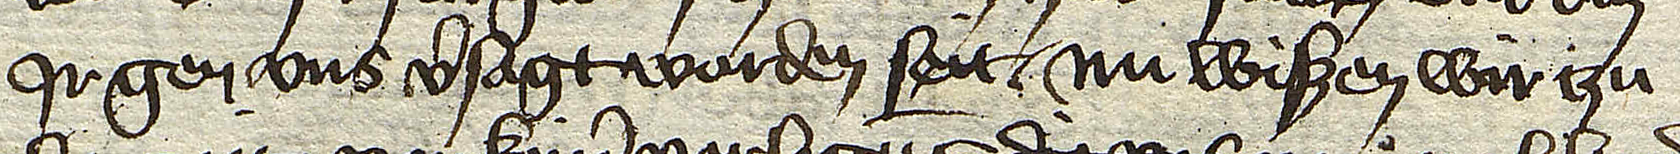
Ir gen vns v*ſagt worden ſeit / Nu wiſſen wir cʒu
